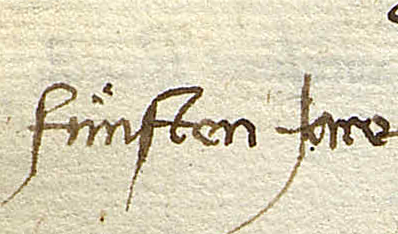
fünften Iare
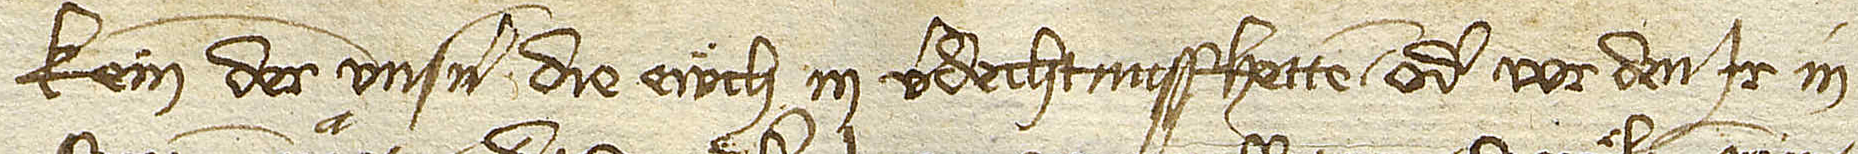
kein* der vnſ*n . die ewch in v*dechtnuſſ hette* / od* vor den Ir in
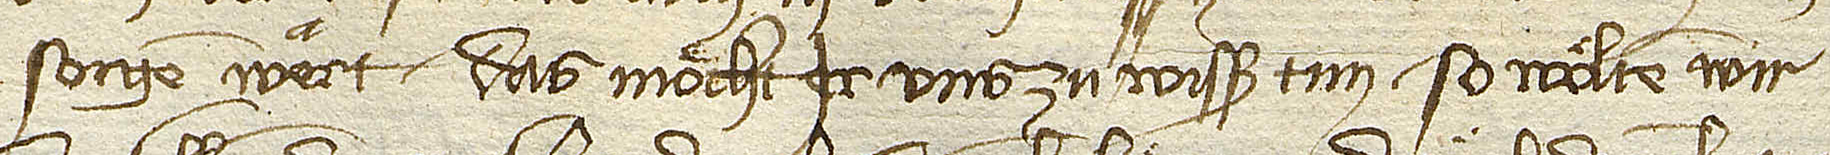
ſorge* wërt / Das möcht Ir vns ʒu wiſſ* tun / ſo wölte* wir
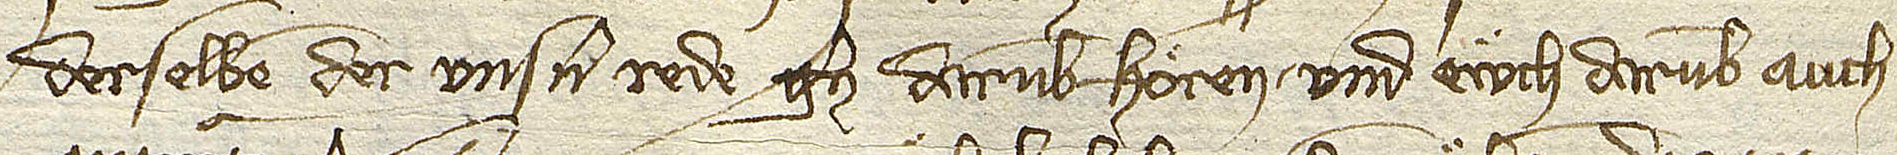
derſelbe* der vnſ*n rede g*n darub* hören / vnd ewch darub* auch
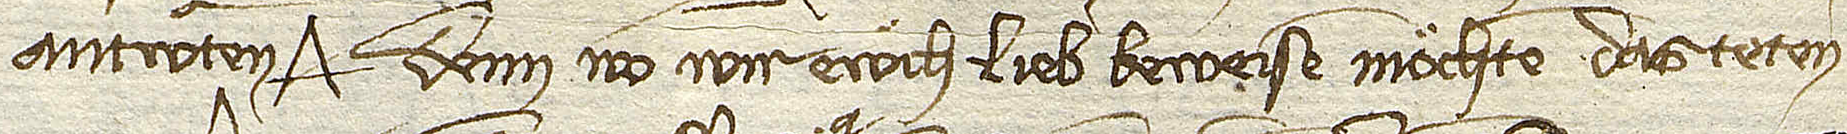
antw*ten Denn wo wir ewch lieb beweiſe möchte* das teten
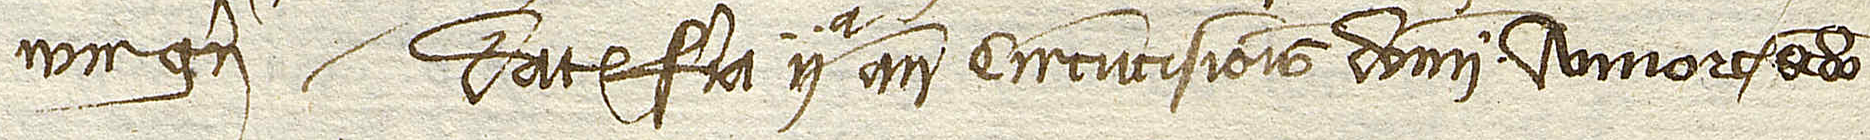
wir gn* / Dat* fia* ii* an* Circuciſiois* domi* Anno ec* Sc*do
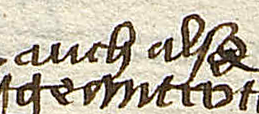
auch alſo
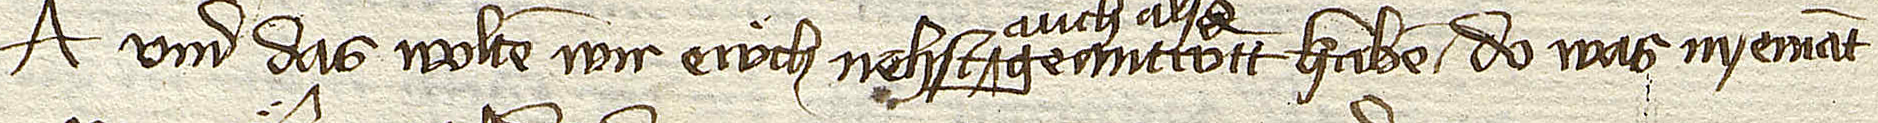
vnd das wolte* wir ewch nehſt geantw*tt habe* / do was nyema*t
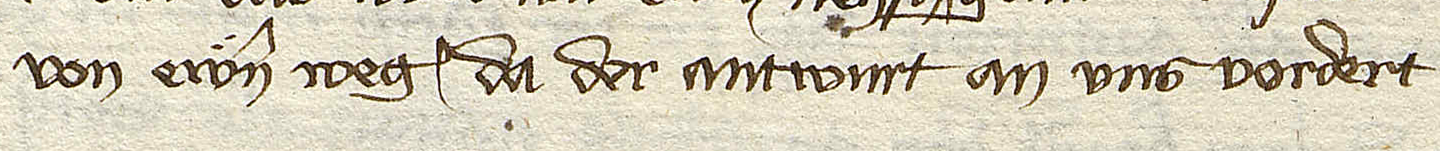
von ew*n weg* da der antwurt an vns vordert
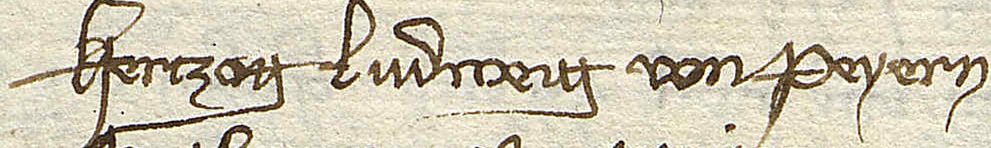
Hercʒog Ludweig von Peyern
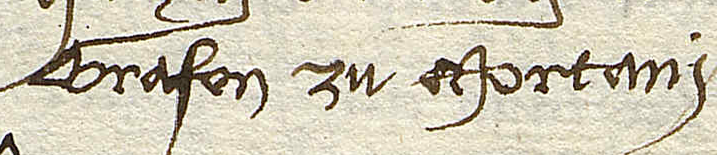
Grafen ʒu Mortani
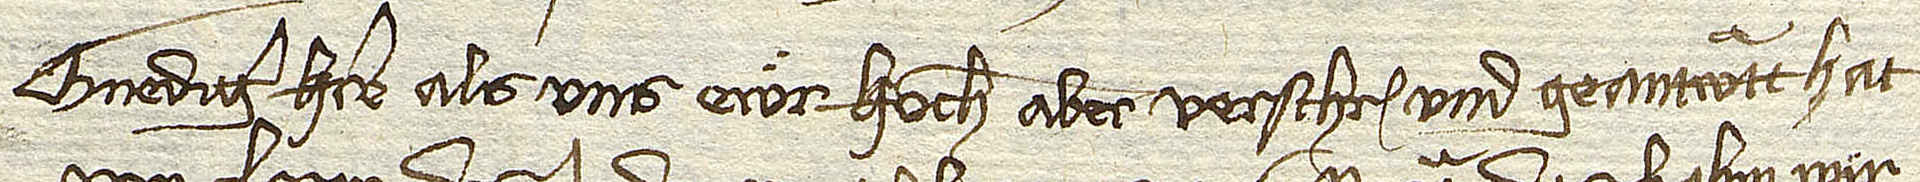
Gnedig* h*re als vns ewr hoch* aber verſchr* vnd geantw*tt hat
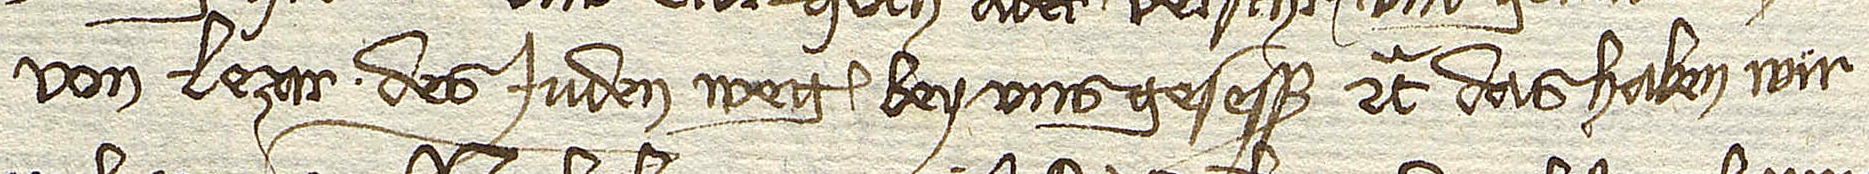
von leʒar . des Iuden weg* bey vns geſeſſ* ec* das haben wir
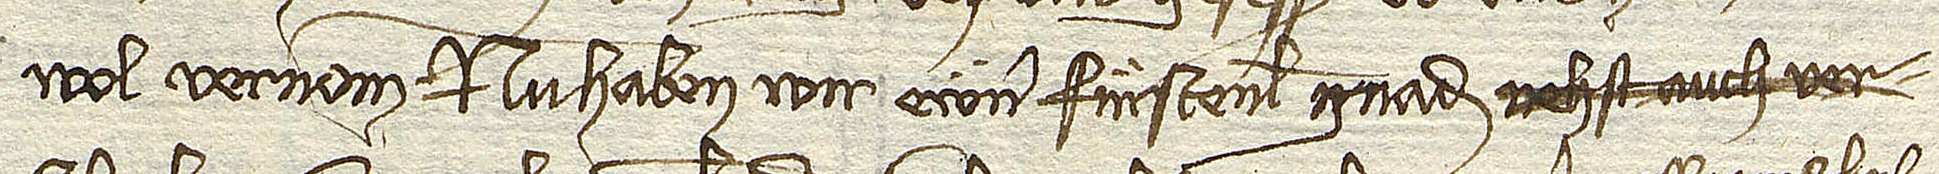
wol vernom* Nu haben wir ew*n fürſtenl* gnad* nehſt auch ver =
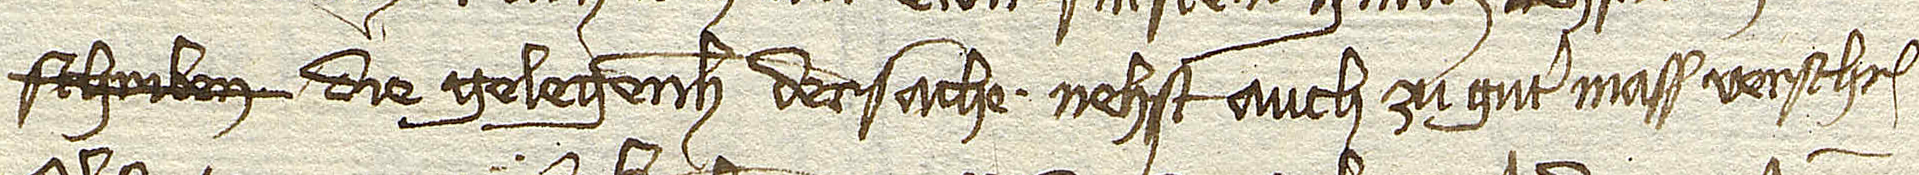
ſchriben . / die gelegenh* der ſache . nehſt auch ʒu gut* maſſ verſchr*
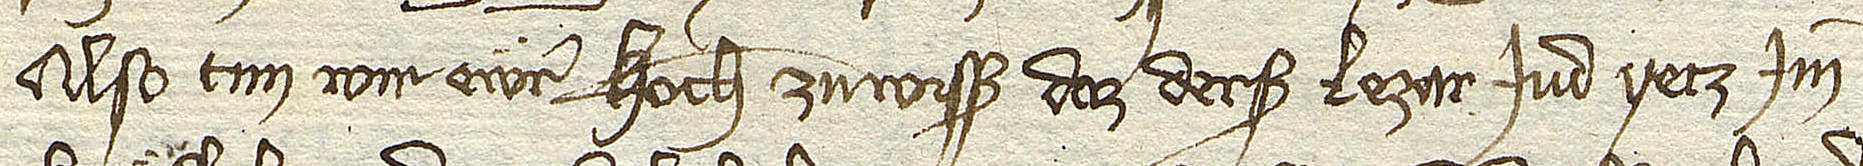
Alſo tun wir ew*r Hoch* ʒuwiſſ* daʒ derſ* leʒar Iud yecʒ Im*
